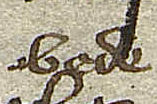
bede
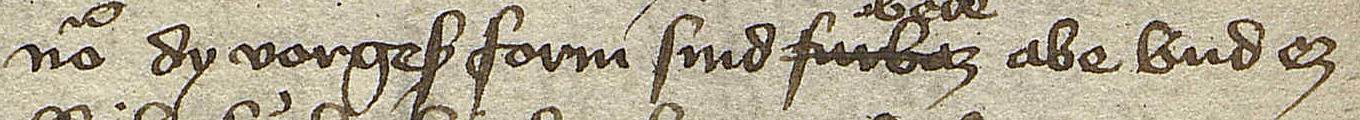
no* dy vorgeſ* form ſind fürbaʒ abe Vnd eʒ
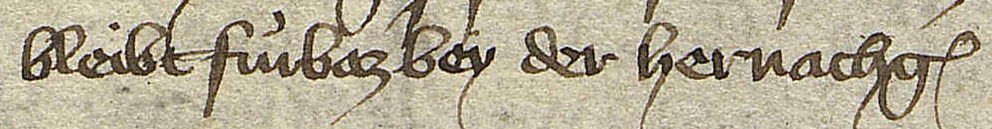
bleibt fürbaʒ bey der hernachg*
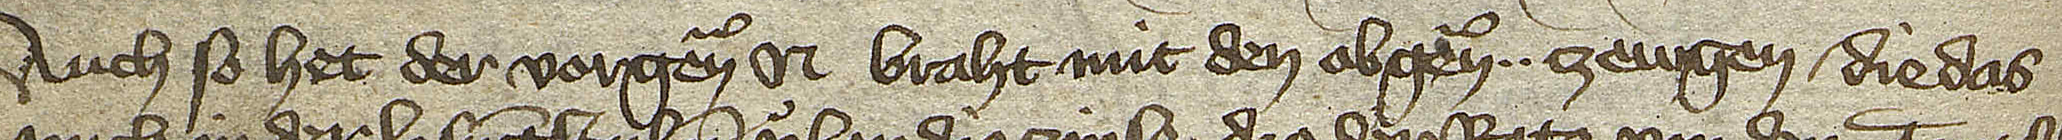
Auch ſo het der vorgen* N braht mit den abgen* . cʒewgen / die das
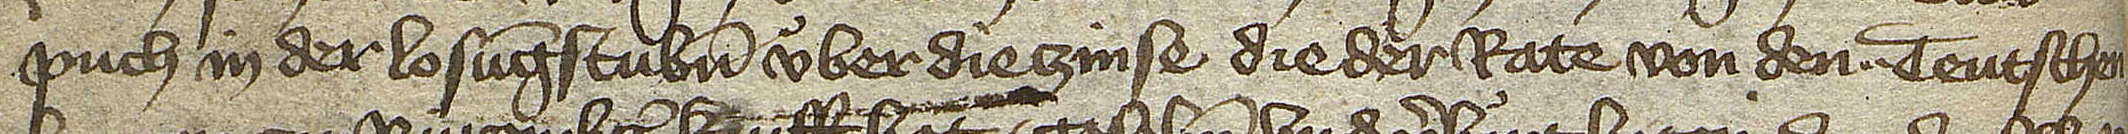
puch in der loſu*gſtub*n v̈ber die cʒinſe die der Rate von den . Teutſchen
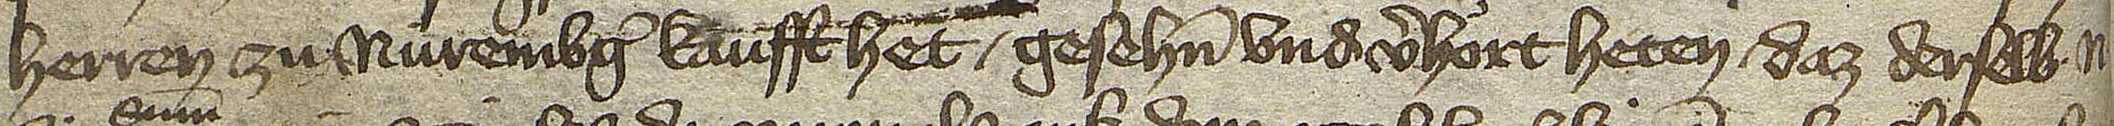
herren cʒu Nüremb*g kaufft het / geſeh*n Vnd v*hört heten / daʒ derſelb* . N
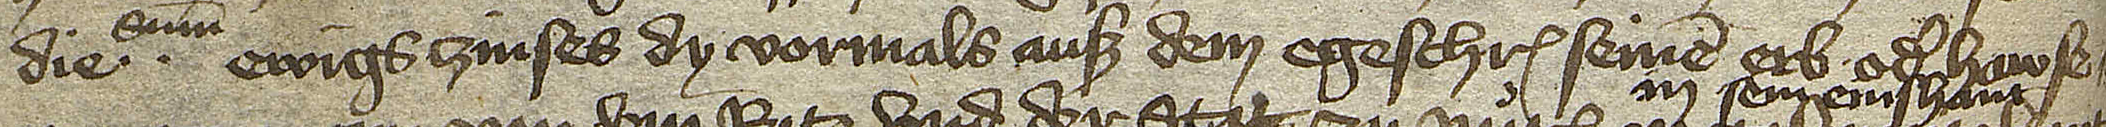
die . ewigs cʒinſes dy vormals auſ* dem egeſchr* ſeine* erb* od* hawſe
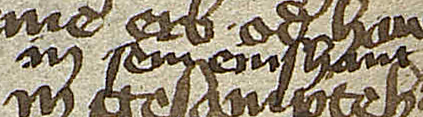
in ſein einſhant
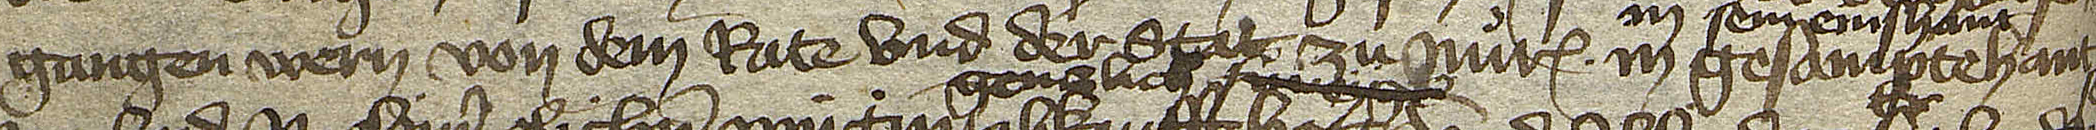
gangen wern von dem Rate Vnd der Stat ʒu Nür* . in geſampte hant
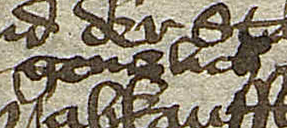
gencʒlich
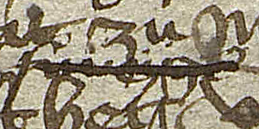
%%%%*
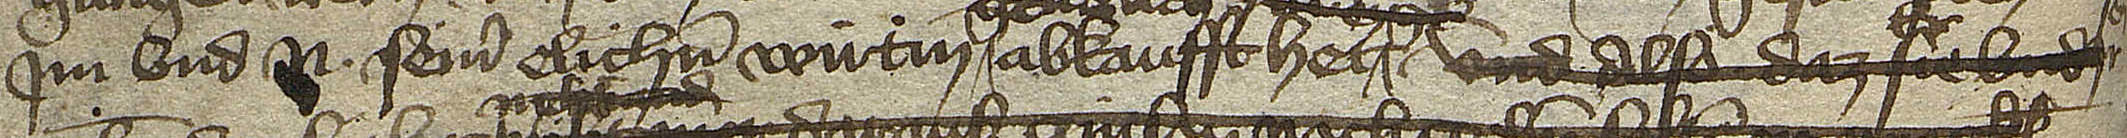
Im Vnd n. ſein* etlich*n wirtin abkaufft hett / Vnd alſo daʒ ſie Vnd Ir
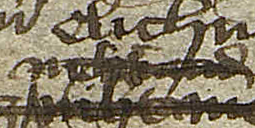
%%%%%%
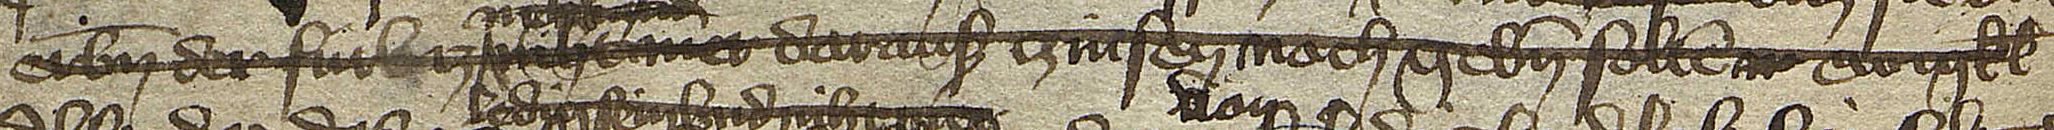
erb*n der fürbaʒ niht mer darauf cʒinſen nach geb*n ſolte ir ewigkl*
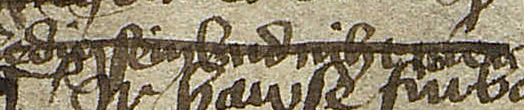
ledig ſein Vnd niht mer
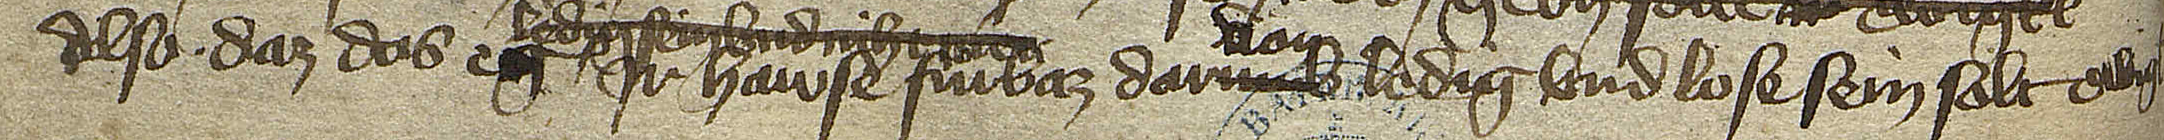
Alſo . daʒ das eg* Ir hawſe fürbaʒ darumb ledig Vnd loſe ſein ſolt ewigkl*
